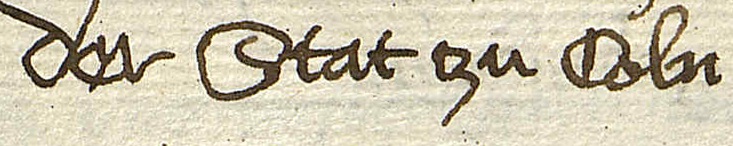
der Stat cʒu Cöln
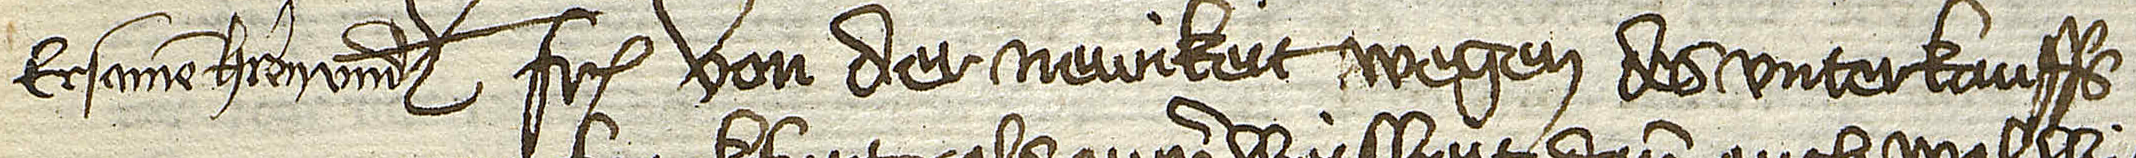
Erſame* h*ren vnd L* fr* Von der newikeit wegen des vnterkauffs
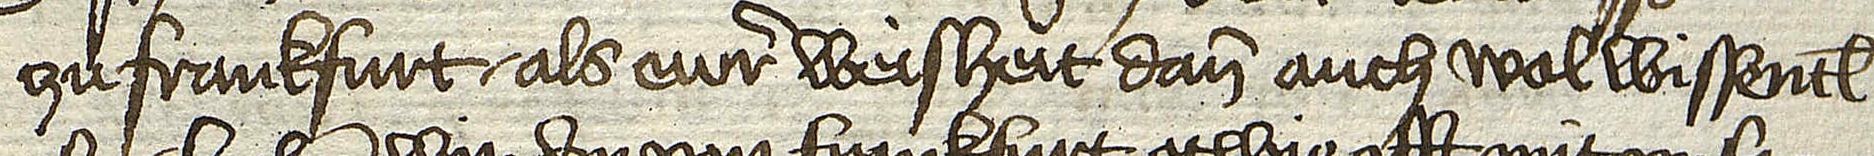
cʒu frankfurt / als ewr* weiſheit dan* auch wol wiſſentl*
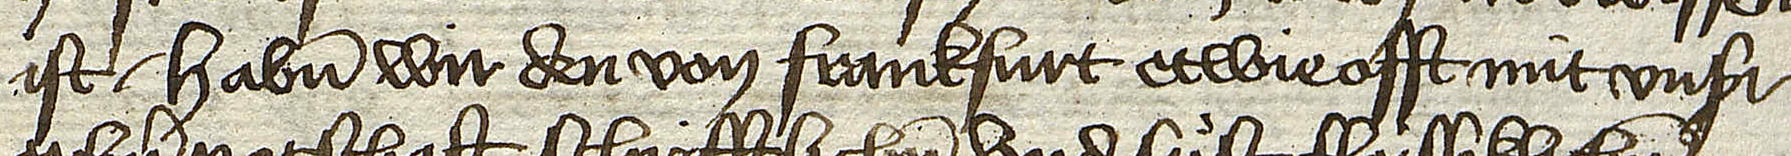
iſt / hab*n wir den von frankfurt etwieofft mit vnſ*r
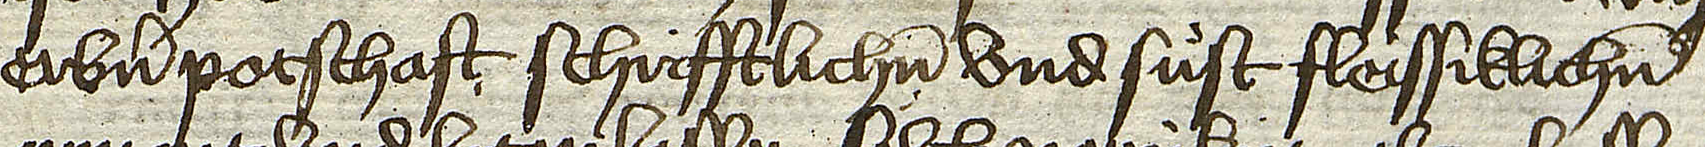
erb*n potſchaft ſchrifftlich*n vnd ſüſt fleiſſiklich*n
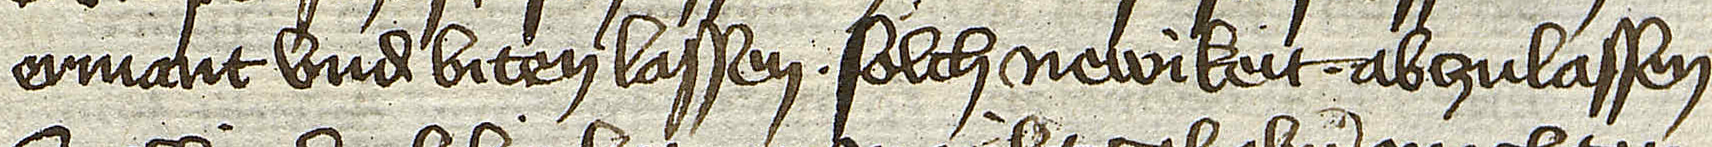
ermant vnd biten laſſen . ſölch newikeit . abcʒulaſſen
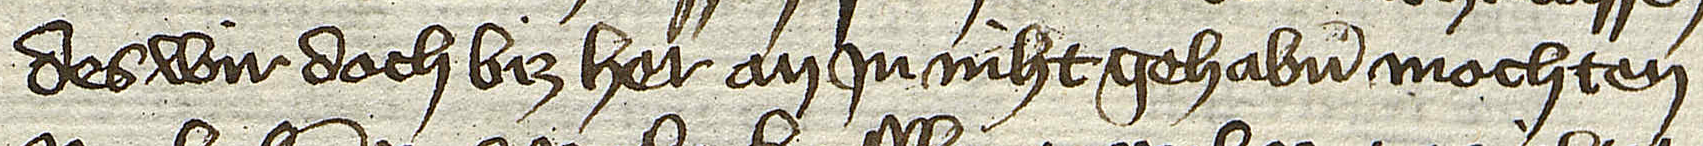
des wir doch biʒ her an In niht gehab*n mochten
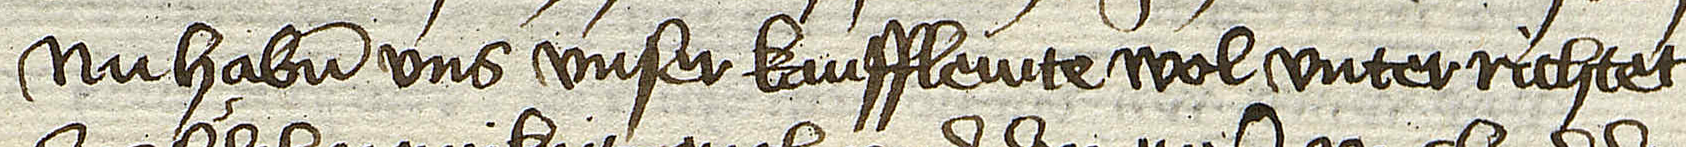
Nu hab*n vns vnſer kaufflewte wol vnter richtet
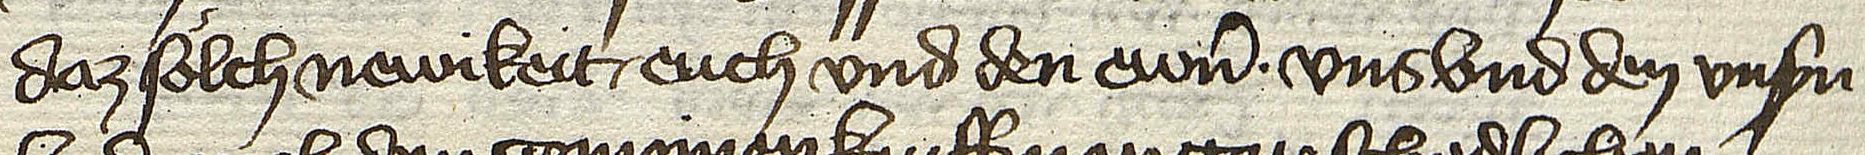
daʒ ſölch newikeit / euch vnd den ew*n . vns vnd den vnſ*n
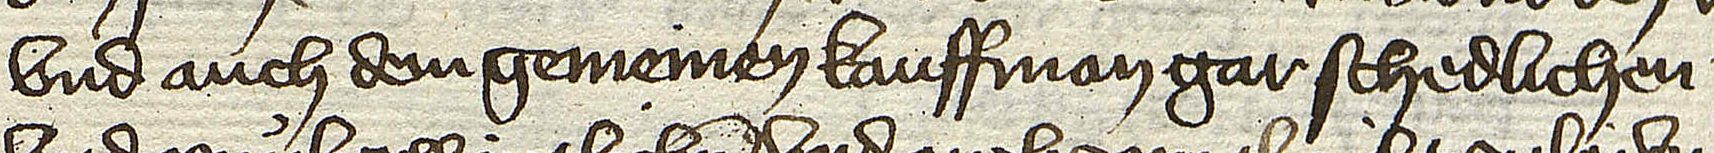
vnd auch dem gemeinen kauffman gar ſchedlichen
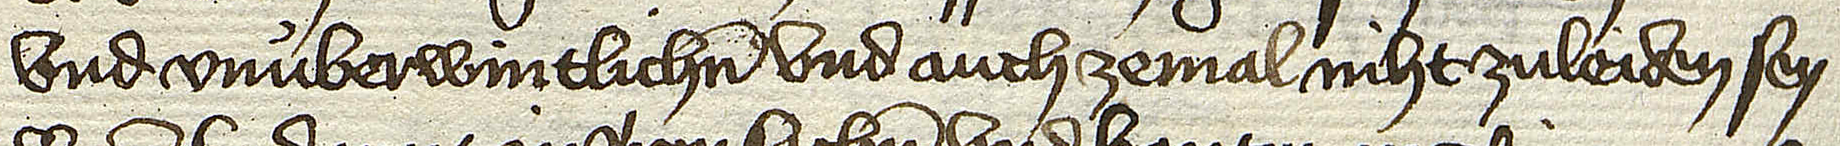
vnd vnüberwintlich*n vnd auch cʒemal niht cʒuleiden ſey
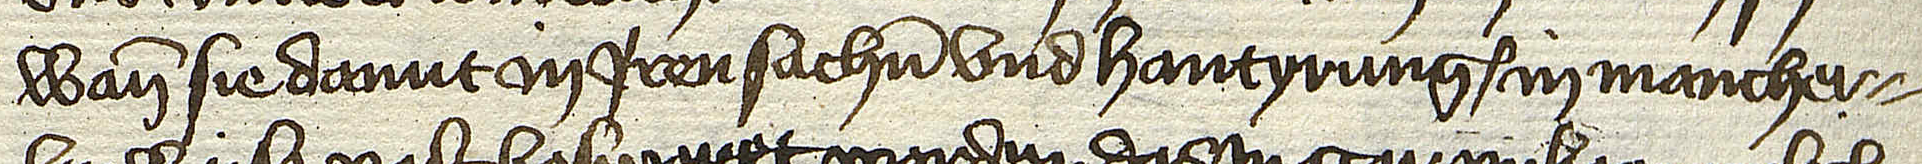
wan* ſie damit in Iren ſach*n vnd hantyrung* in mancher =
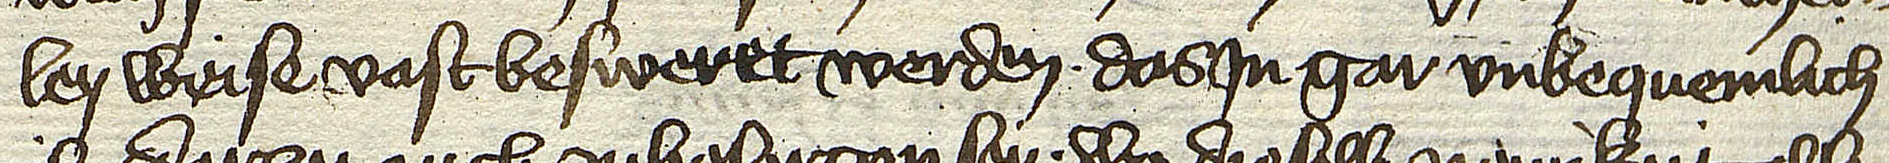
ley weiſe vaſt beſweret werden . das In gar vnbequemlich
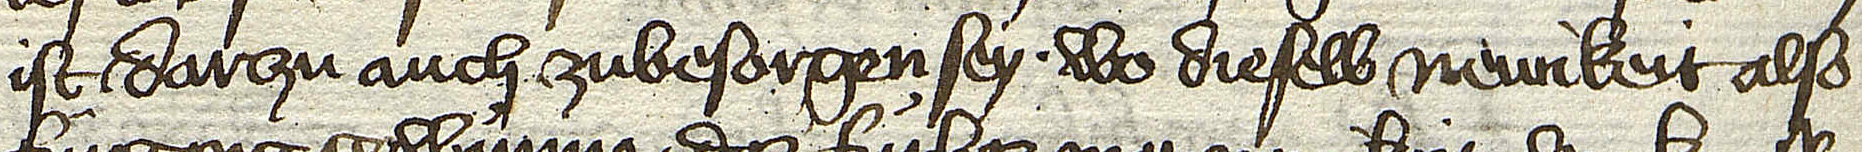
iſt / darcʒu auch cʒubeſorgen ſey . wo dieſelb newikeit alſo
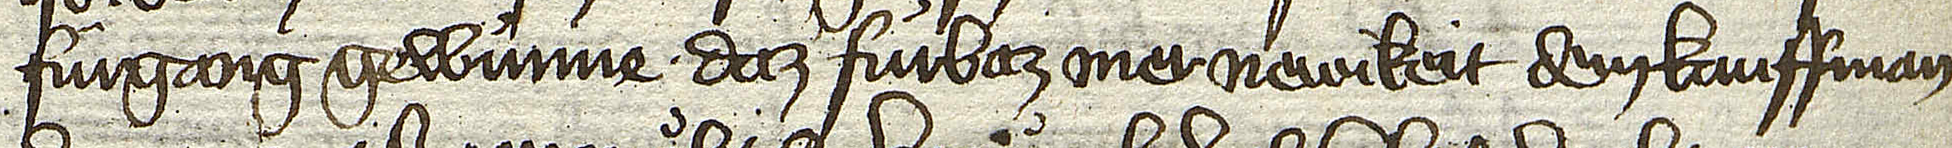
fürgang gewünne . daʒ fürbaʒ mer newikeit dem kauffman
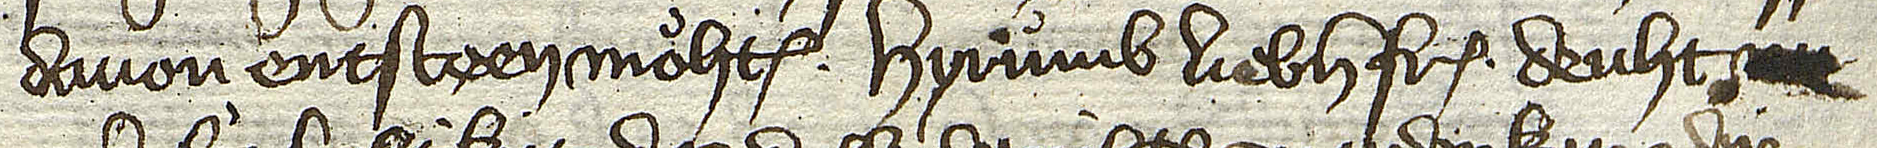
dauon entſteen möht* . Hyrümb lieb*n fr* deuht nu
